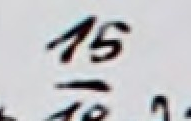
15
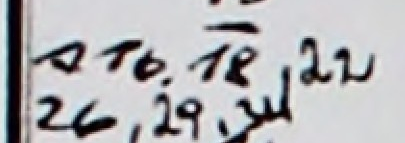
s 16, 18, 22
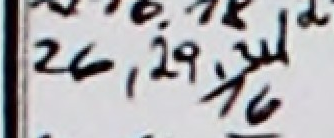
26, 29, 34
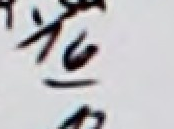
16
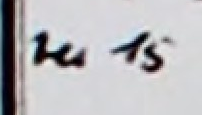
zu 15
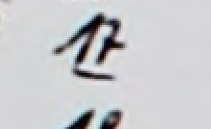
17
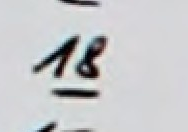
18
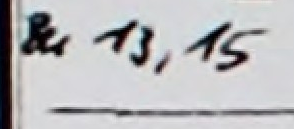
Zu 13, 15
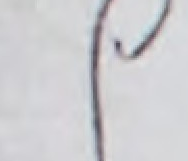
?
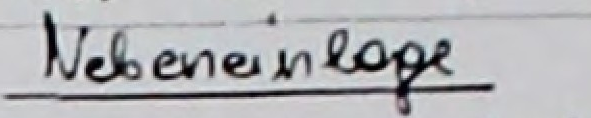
Neheneinlage
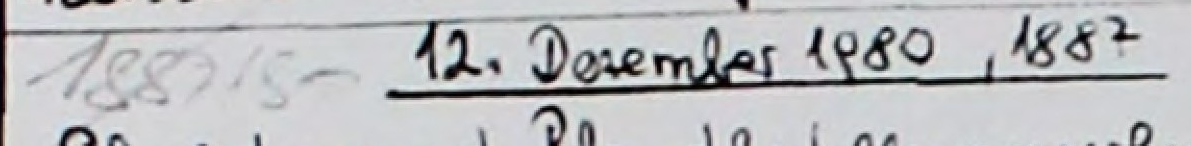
1887/8 - 12. Dezember 1980, 1887
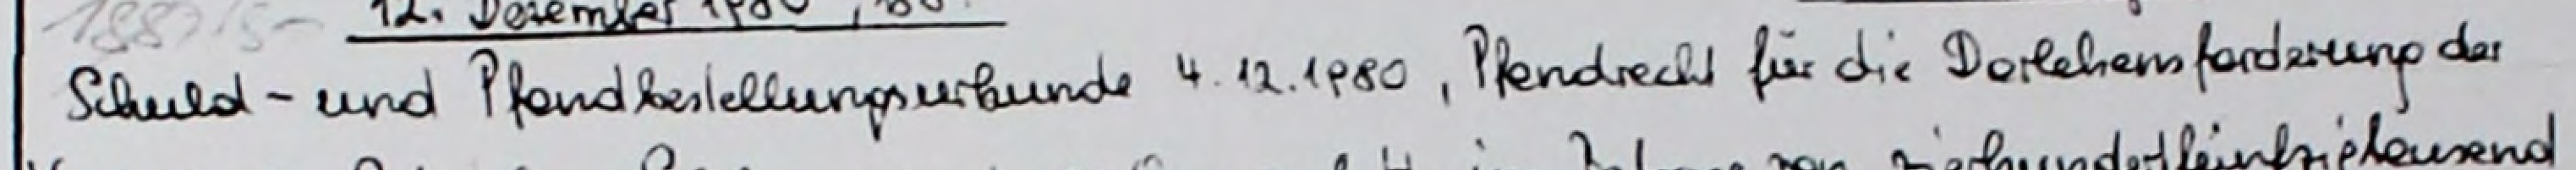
Schuld- und Pfandbestellungsurkunde 4.12.1980, Pfandrecht für die Darlehensforderung der
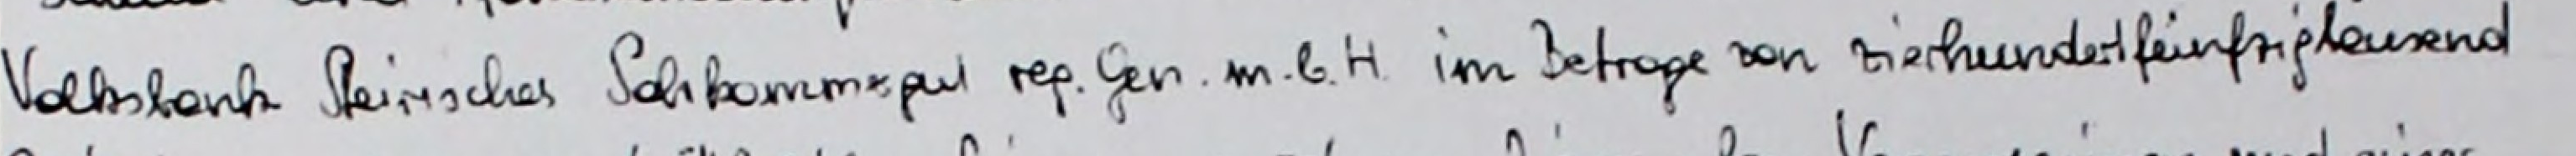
Volksbank Steirisches Salzkammergut reg. Gen. m. C. H. im Betrage von vierhundertfünfzigtausend
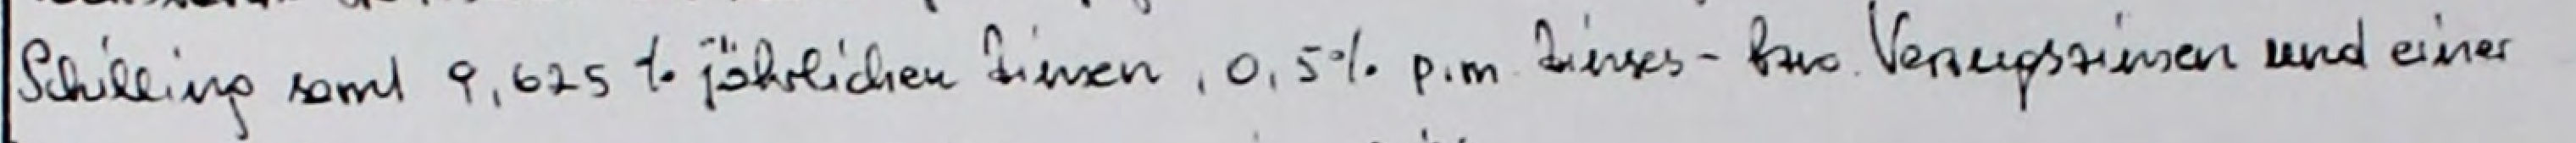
Schilling samt 9,625 % jährlichen dienen, 0,5 % p. m dierses -b??. Verzugszinsen und einer
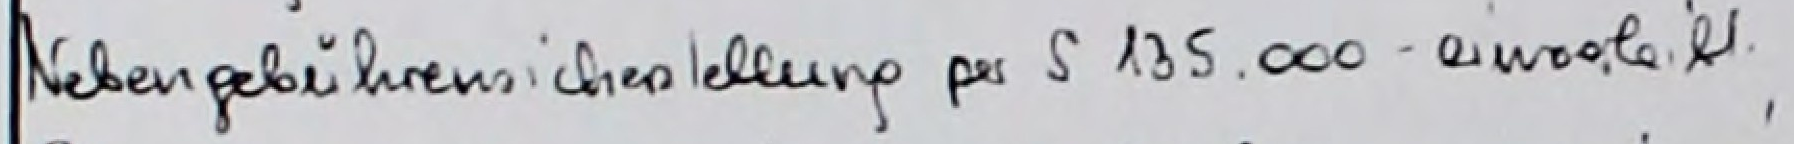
Nebengebührensicherstellung per S 135.000 - einverleibt.
